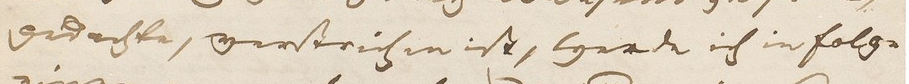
gedachte, verstrichen ist, werde ich in Folge
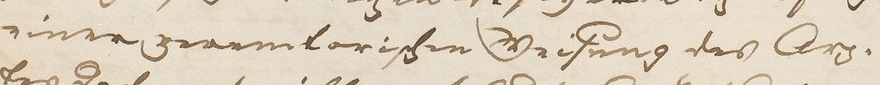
einer peremtorischen Weisung des Arz-
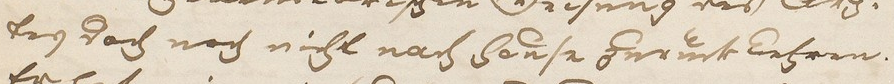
tes doch noch nicht nach Hause zurükkehren.
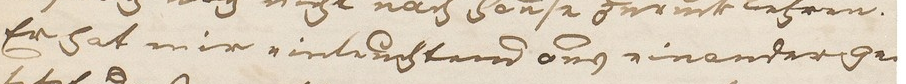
Er hat mir einleuchtend aus einander ge-
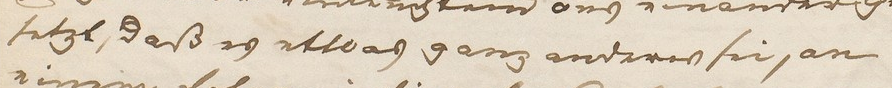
setzt, daß es etwas ganz anderes sei, an
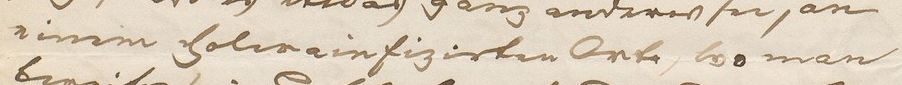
einem cholerainfizirten Orte, wo man
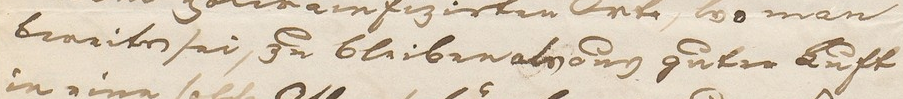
bereits sei, zu bleiben als aus guter Luft
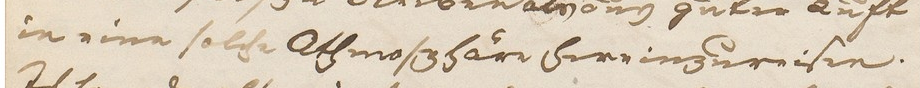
in eine solche Athmosphäre hereinzureisen.
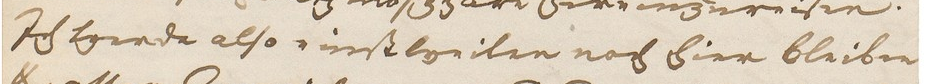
Ich werde also einstweilen noch hier bleiben
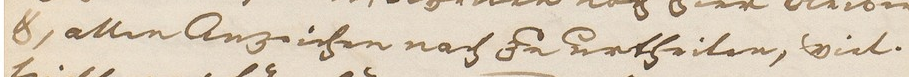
&, allen Anzeichen nach zu urtheilen, viel-
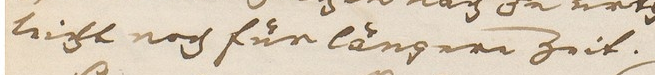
leicht noch für längere Zeit.
